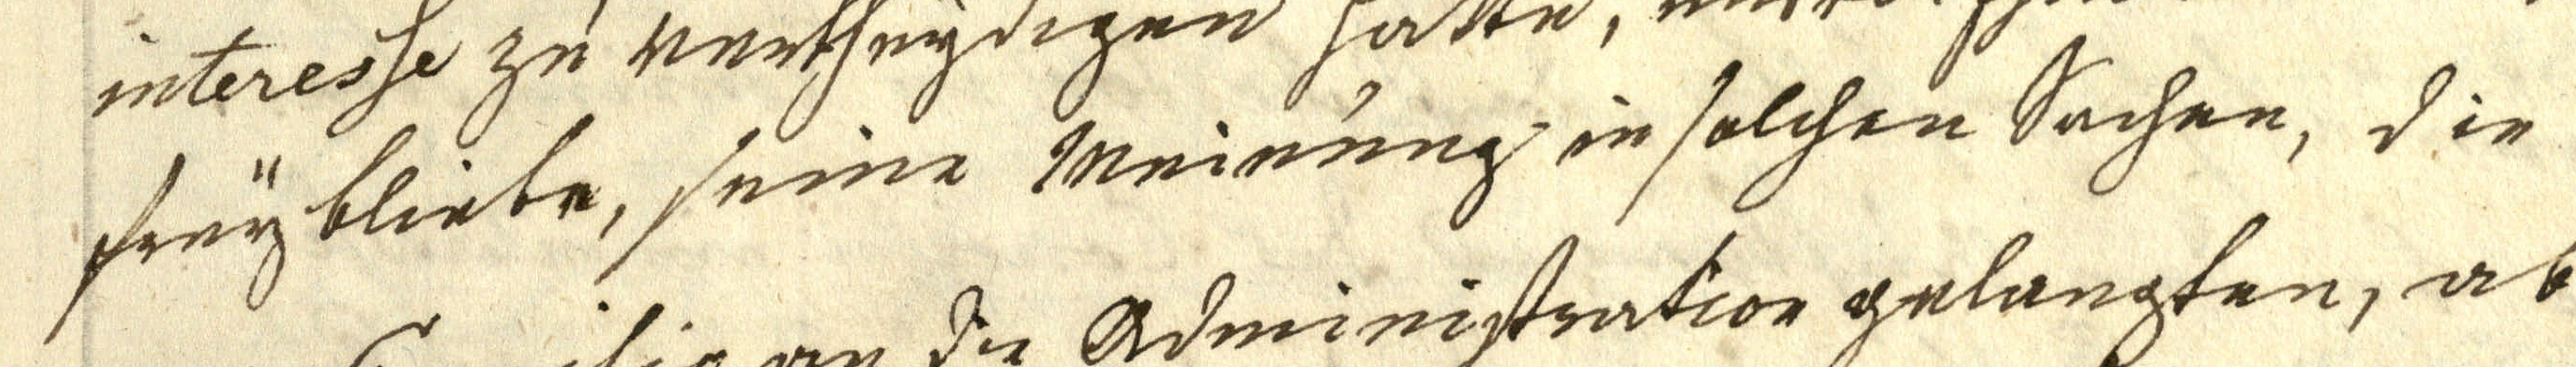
freÿ bliebe, seine Meinung in solchen Sachen, die
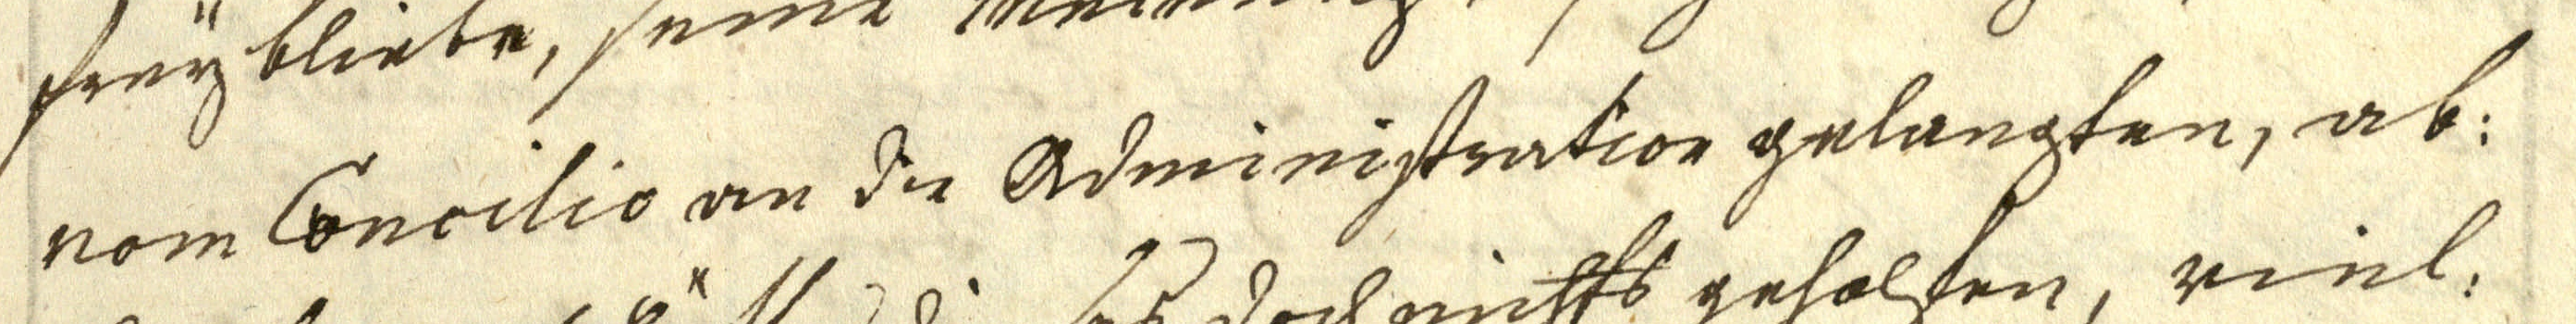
vom Concilio an die Administration gelangten, ab¬
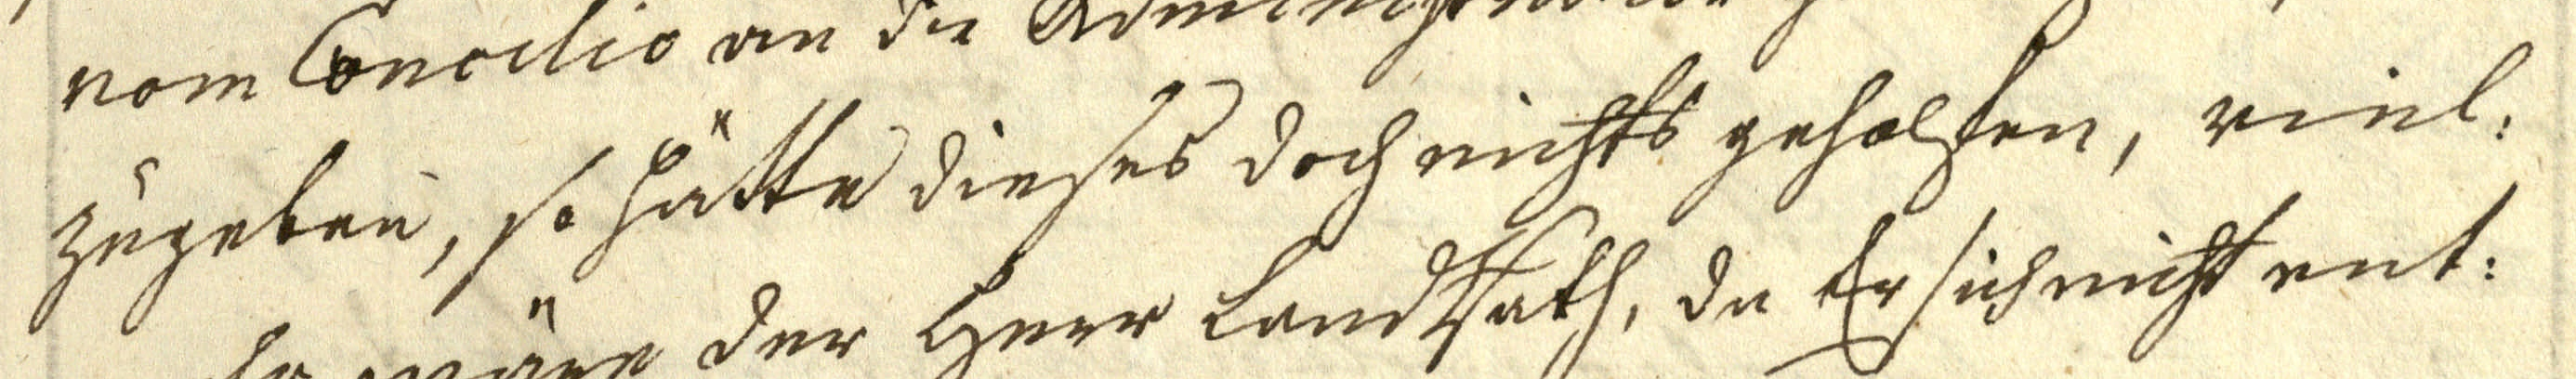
zugeben, so hätte dieses doch nichts geholfen, viel¬
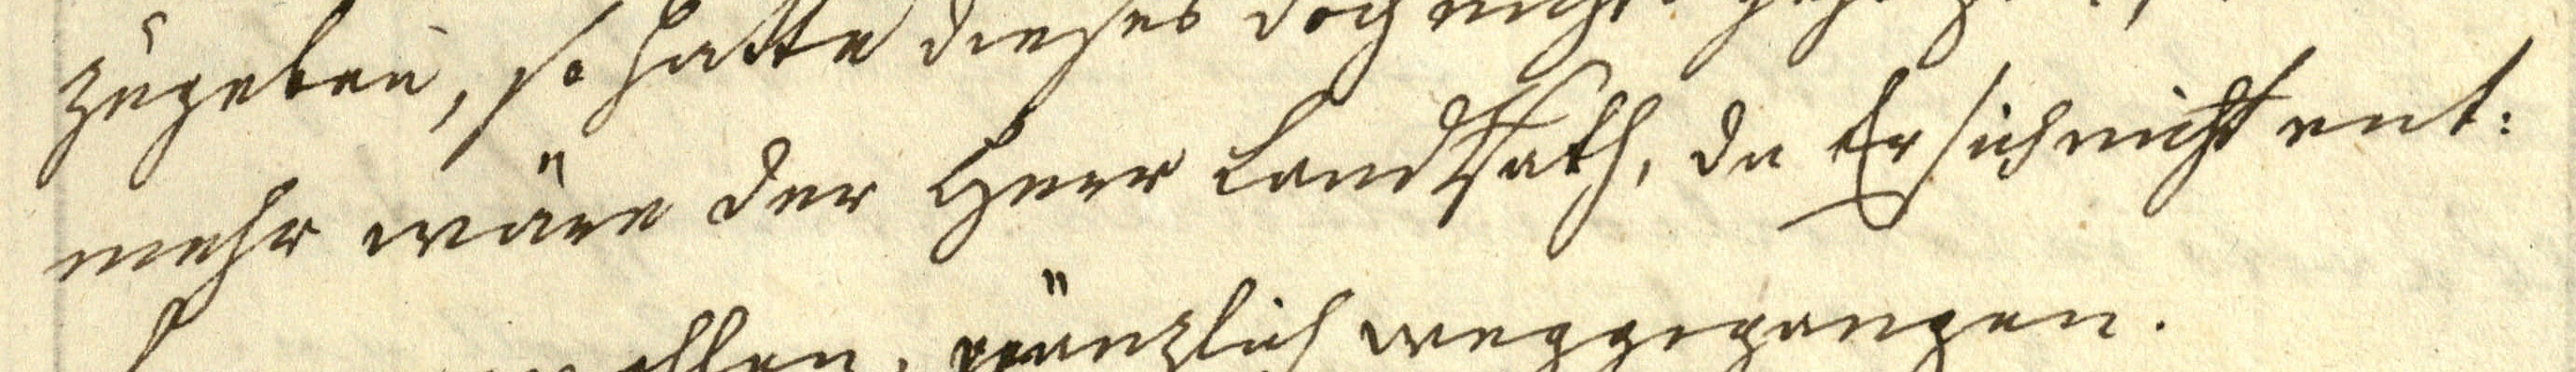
mehr wäre der Herr LandRath, da Er sich nicht ent¬
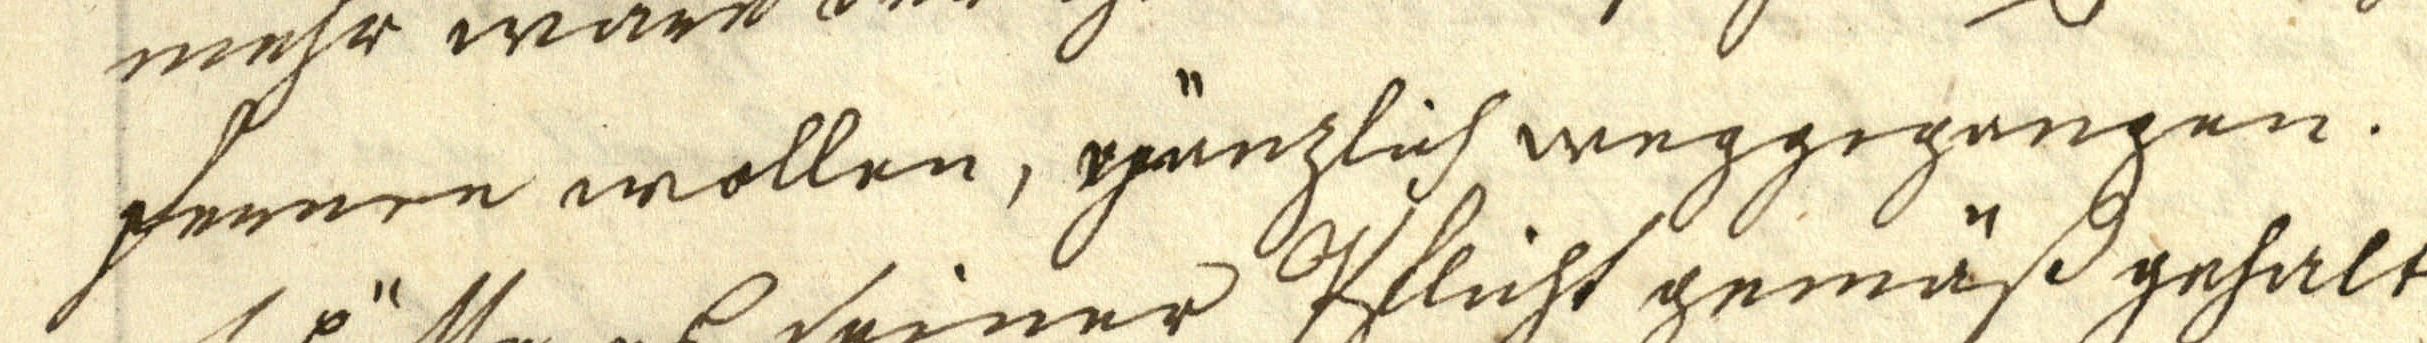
fernen wollen, gänzlich weggegangen.
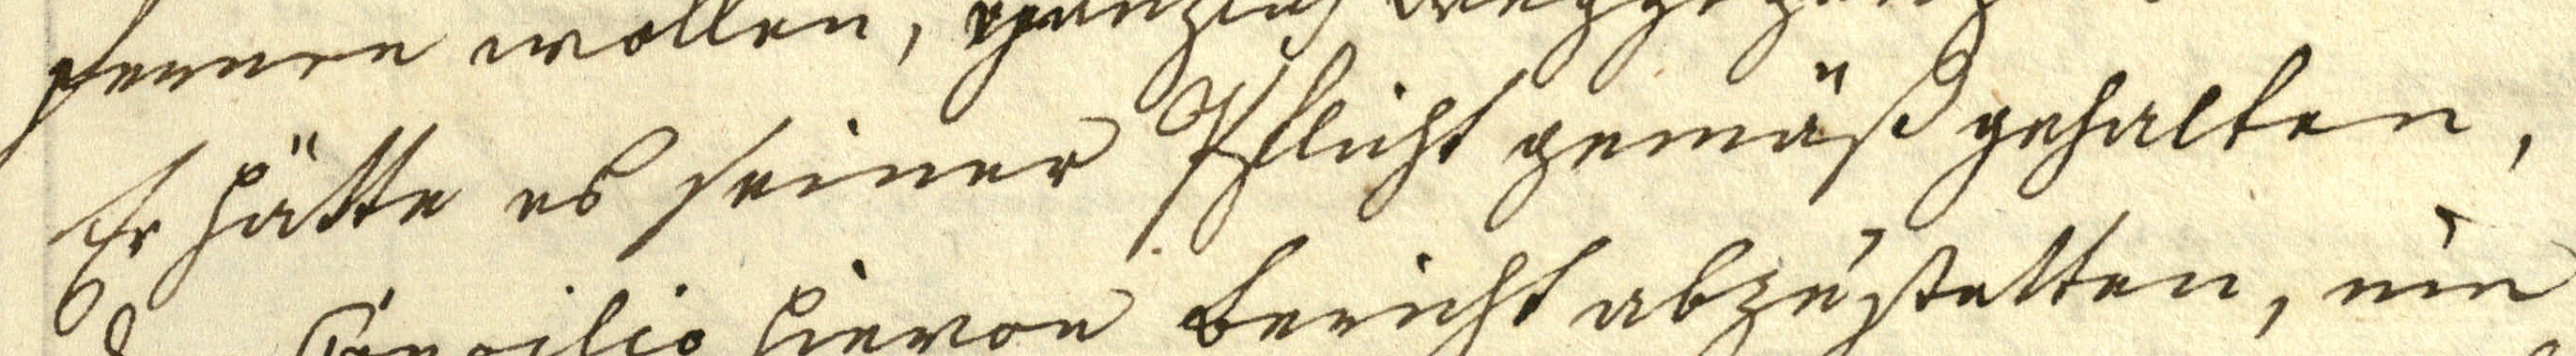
Er hätte es seiner Pflicht gemäß gehalten,
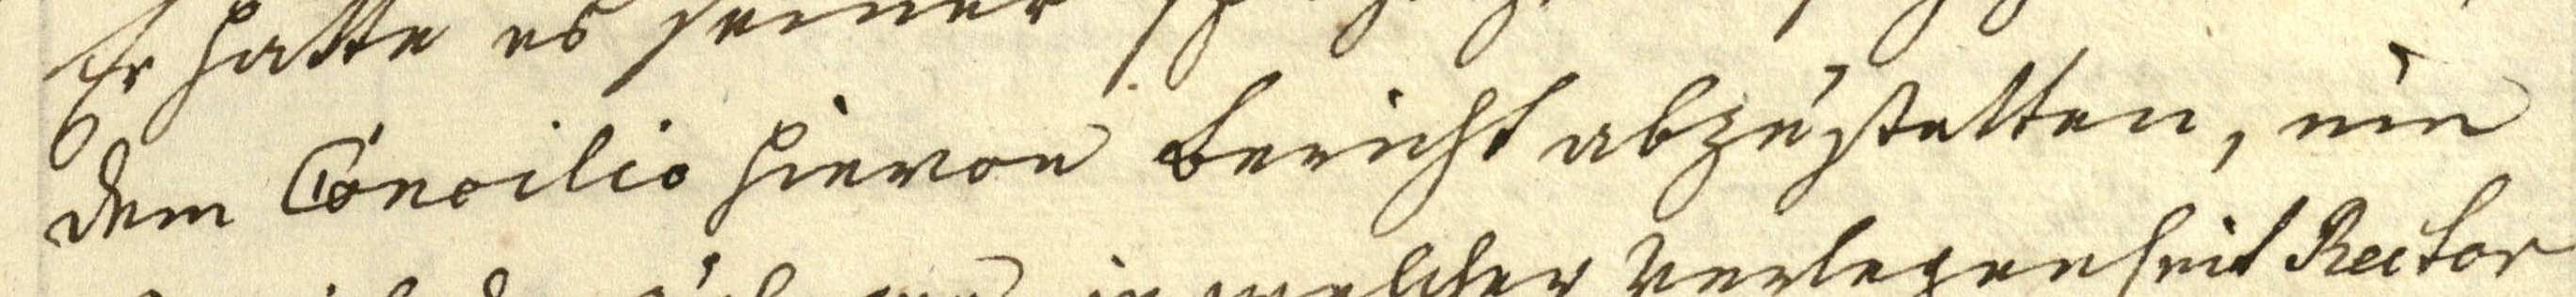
dem Concilio hievon Bericht abzustatten, um
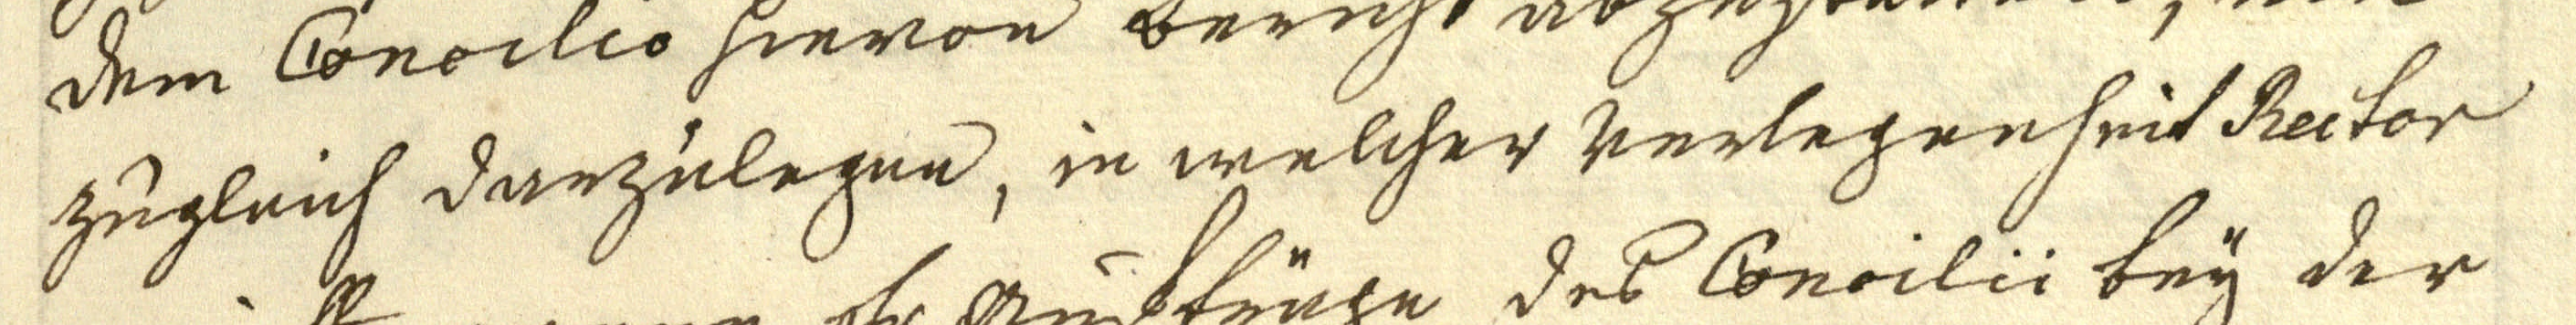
zugleich darzulegen, in welcher Verlegenheit Rector
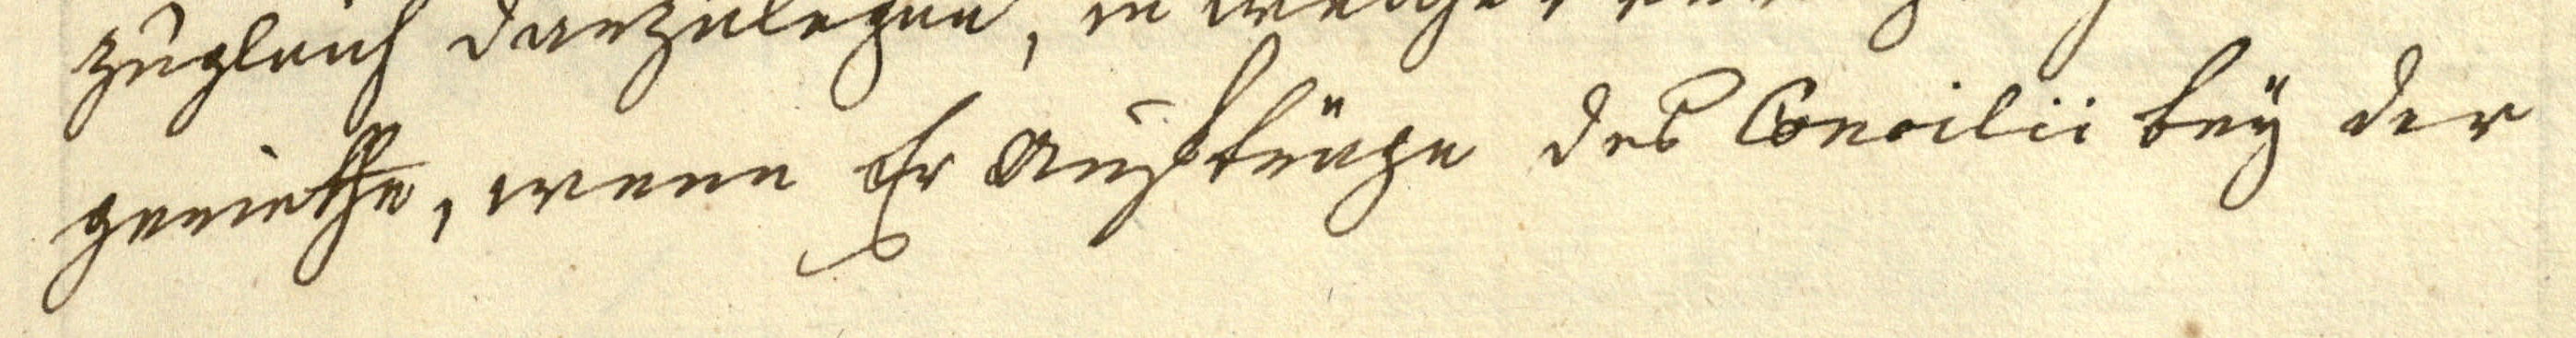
geriethe, wenn Er Aufträge des Concilii beÿ der
